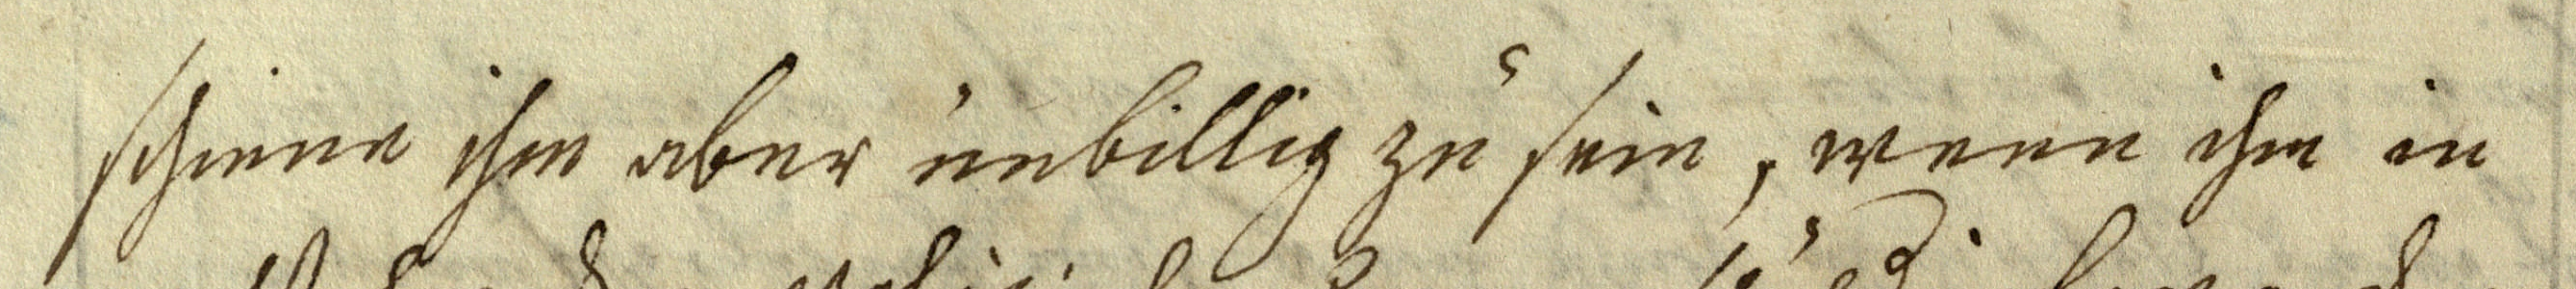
schiene ihm aber unbillig zu sein, wenn ihm in
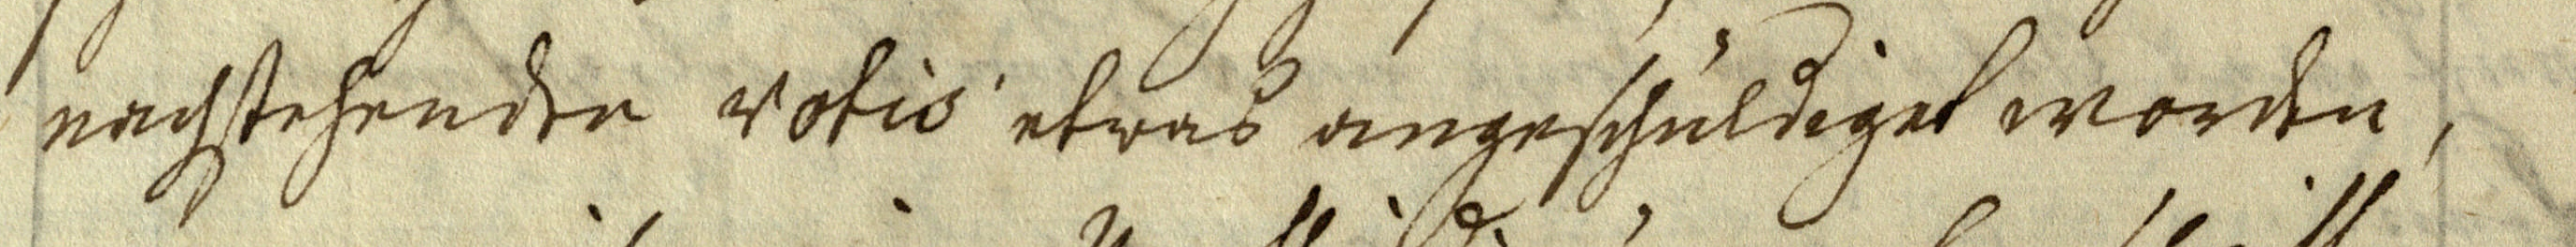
nachstehenden votis etwas angeschuldiget worden,
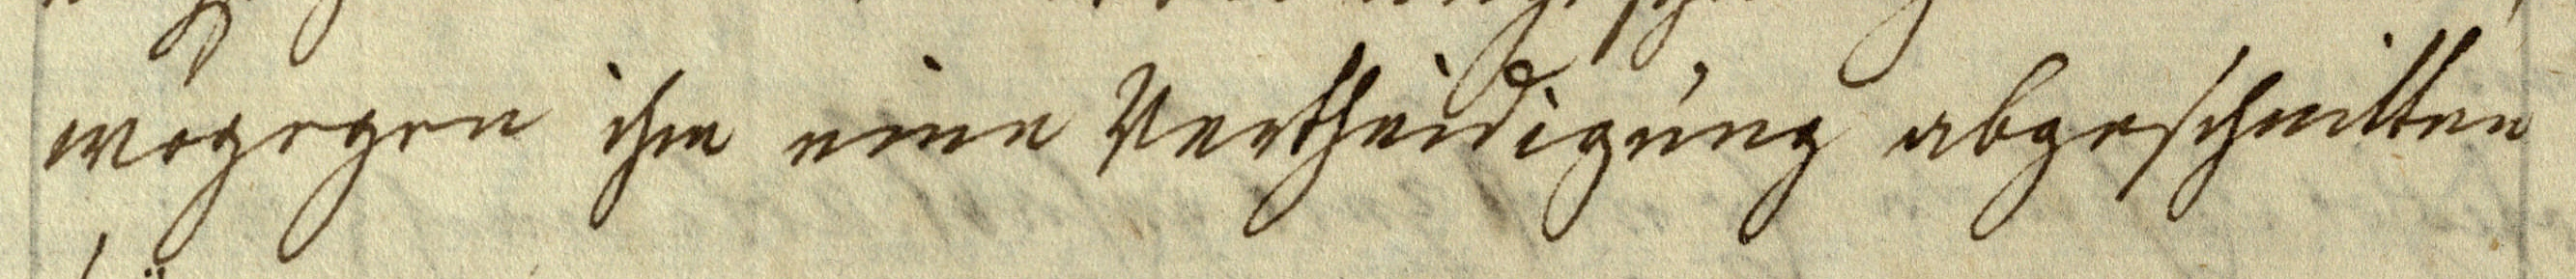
wogegen ihm eine Vertheidigung abgeschnitten
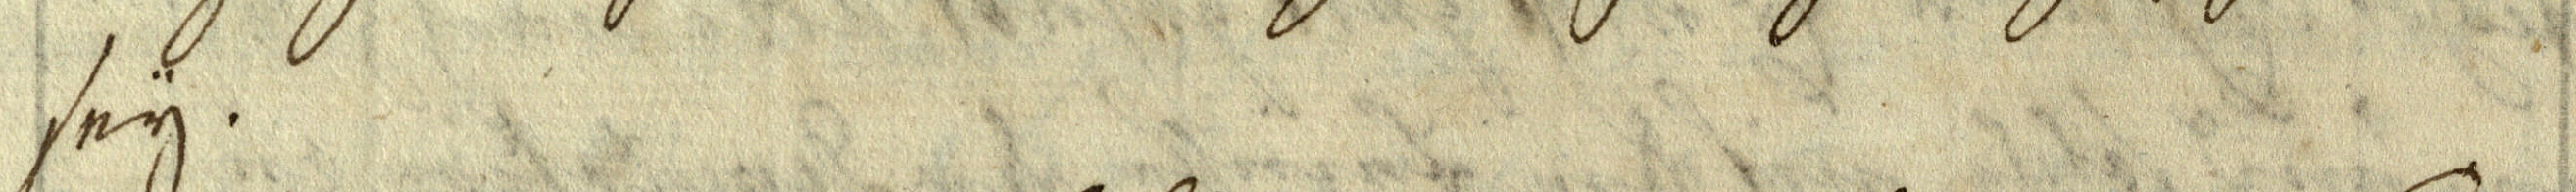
seÿ.
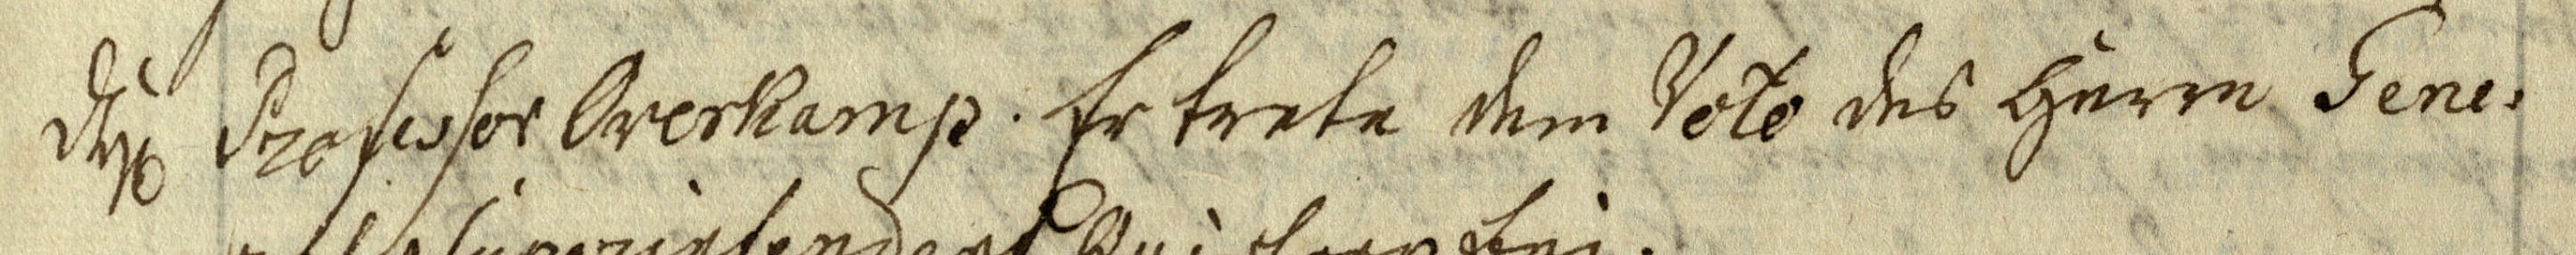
dh Professor Overkamp. Er trete dem Voto des Herrn Gene¬
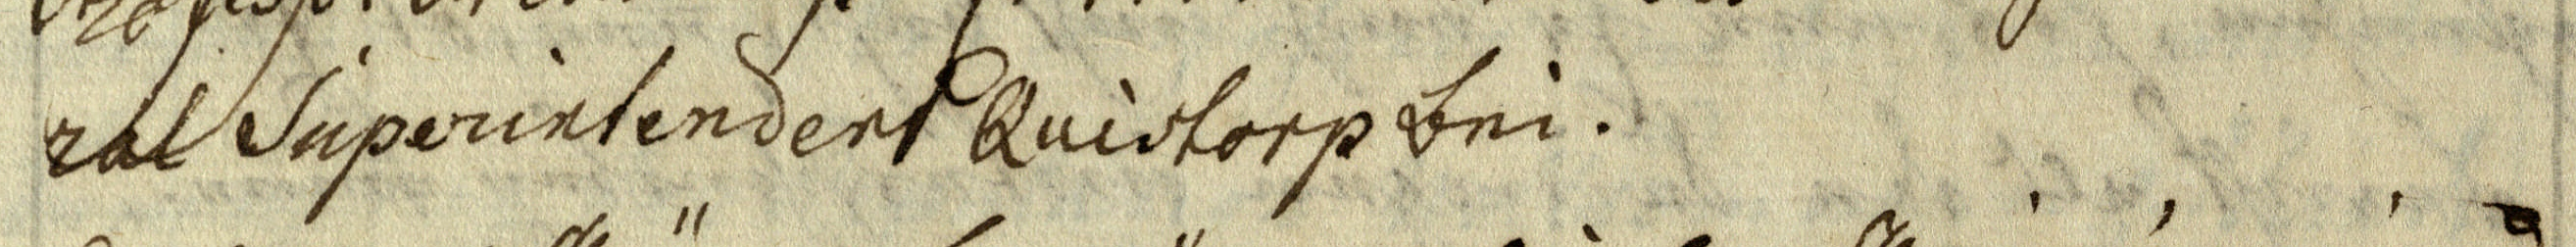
ral Superintendent Quistorp bei.
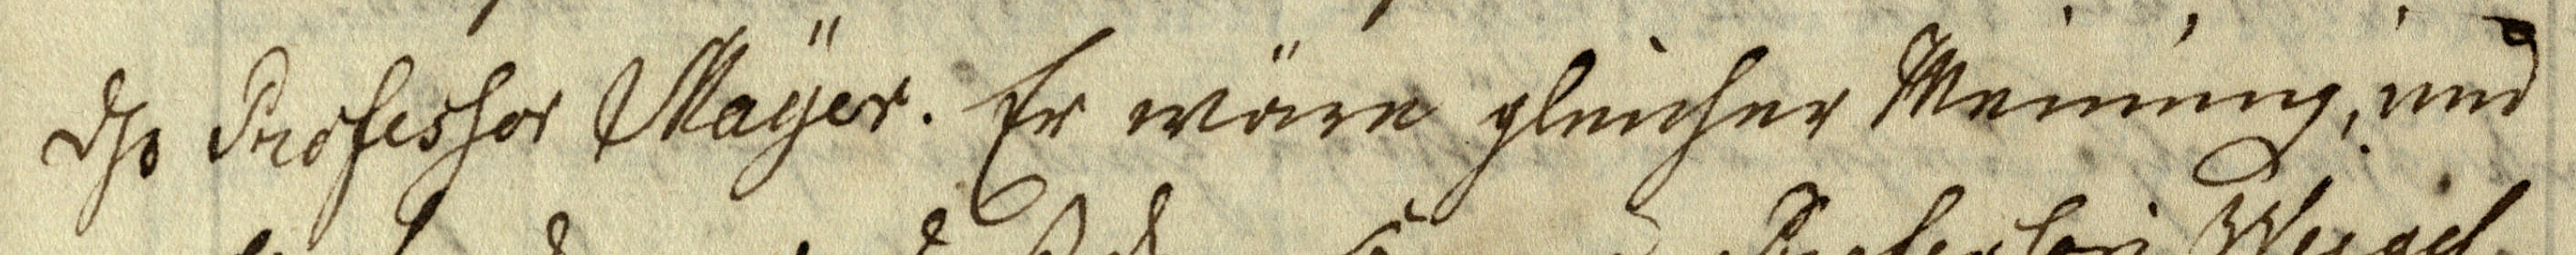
dh Professor Maÿer. Er wäre gleicher Meinung, und
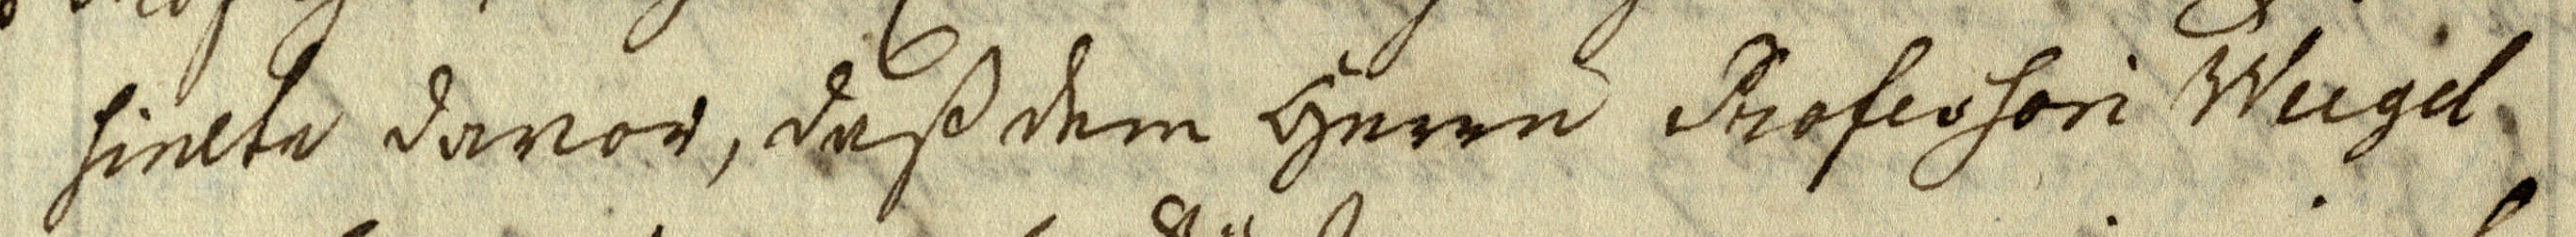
hielte davor, daß dem Herrn Professori Weigel
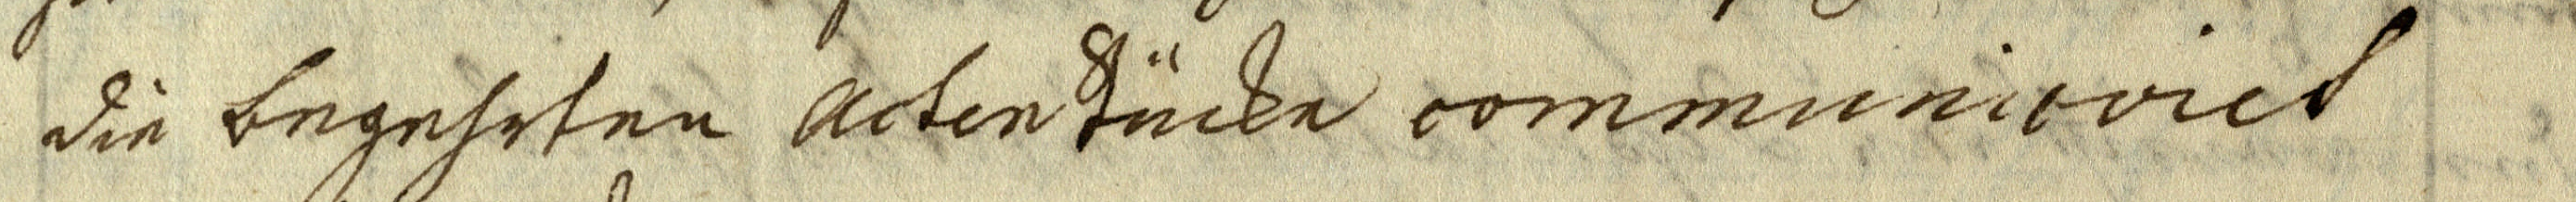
die begehrten Actenstücke communiciret
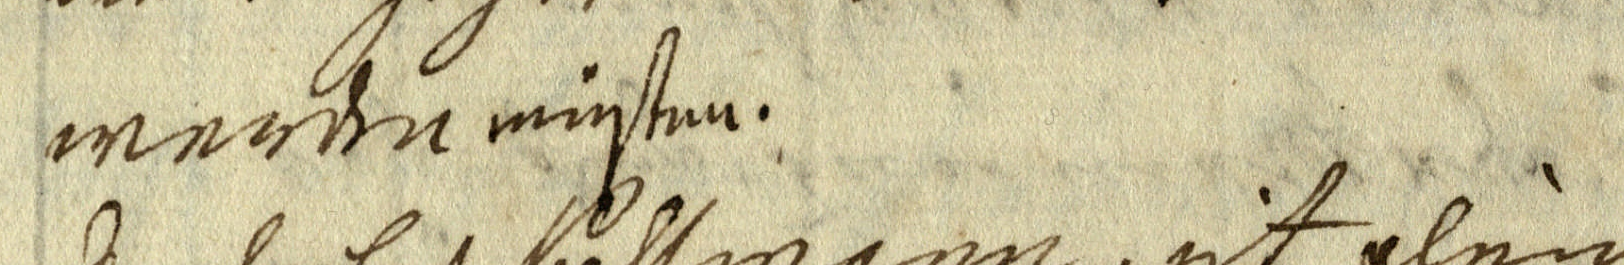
werden müsten.
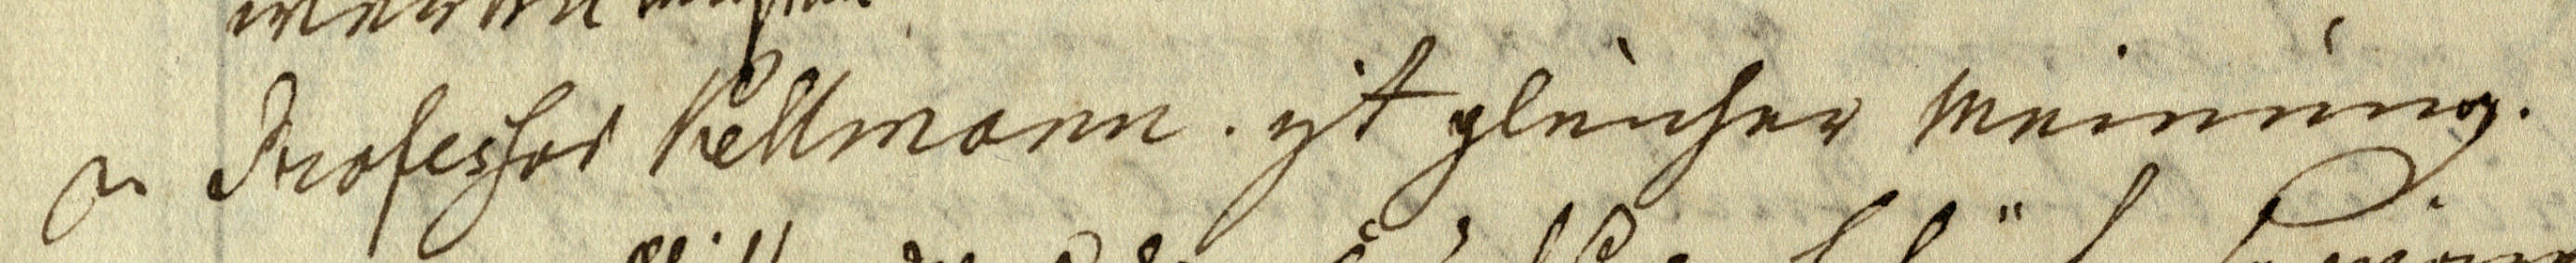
u Professor Kellmann. ist gleicher Meinung.
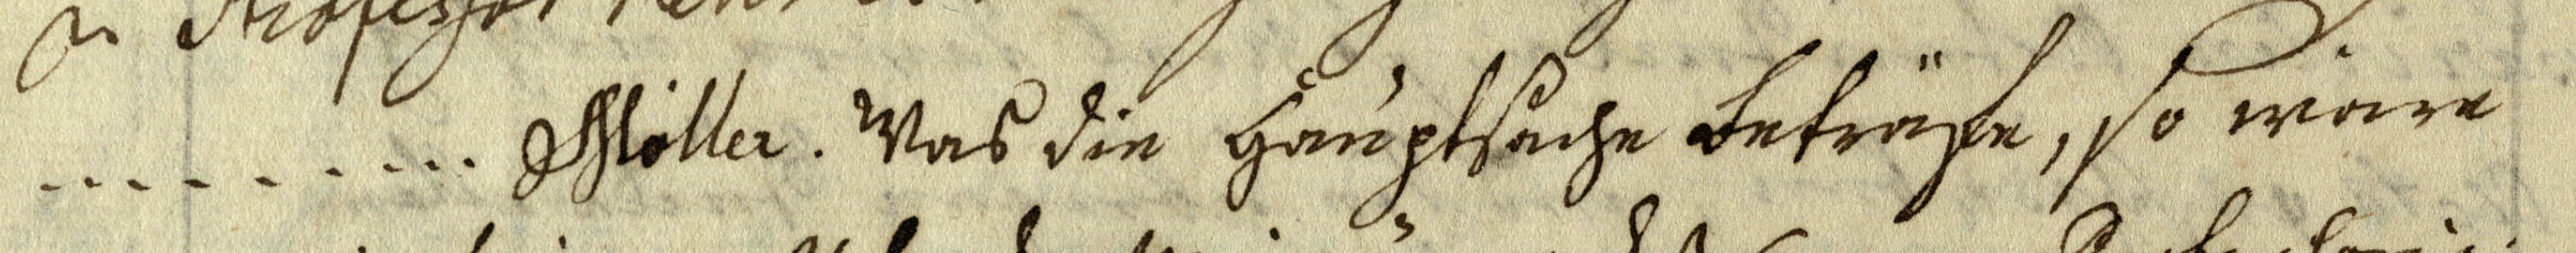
Möller. Was die Hauptsache beträfe, so wäre
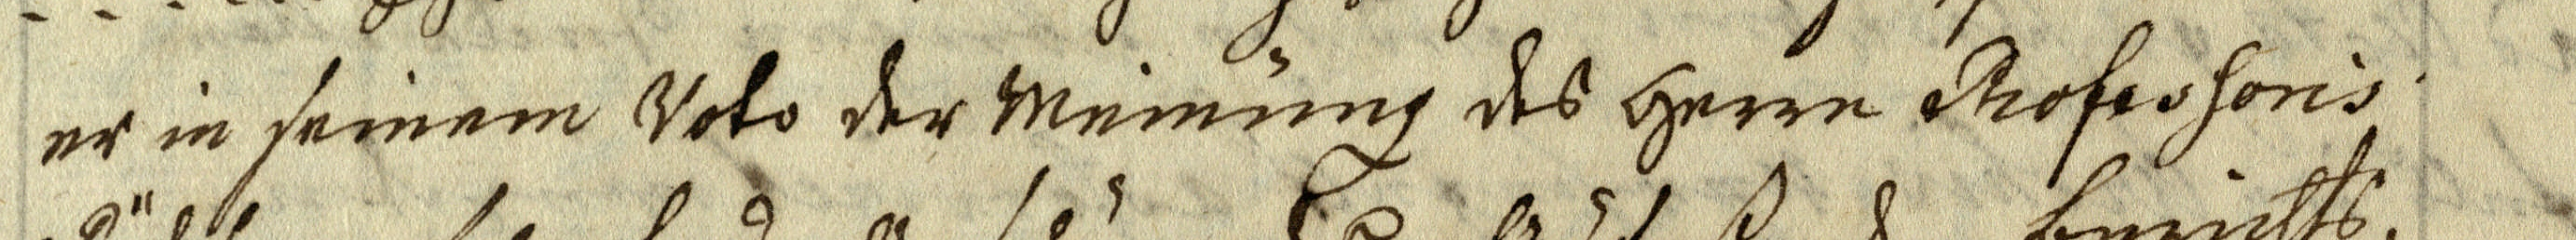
er in seinem Voto der Meinung des Herrn Professoris
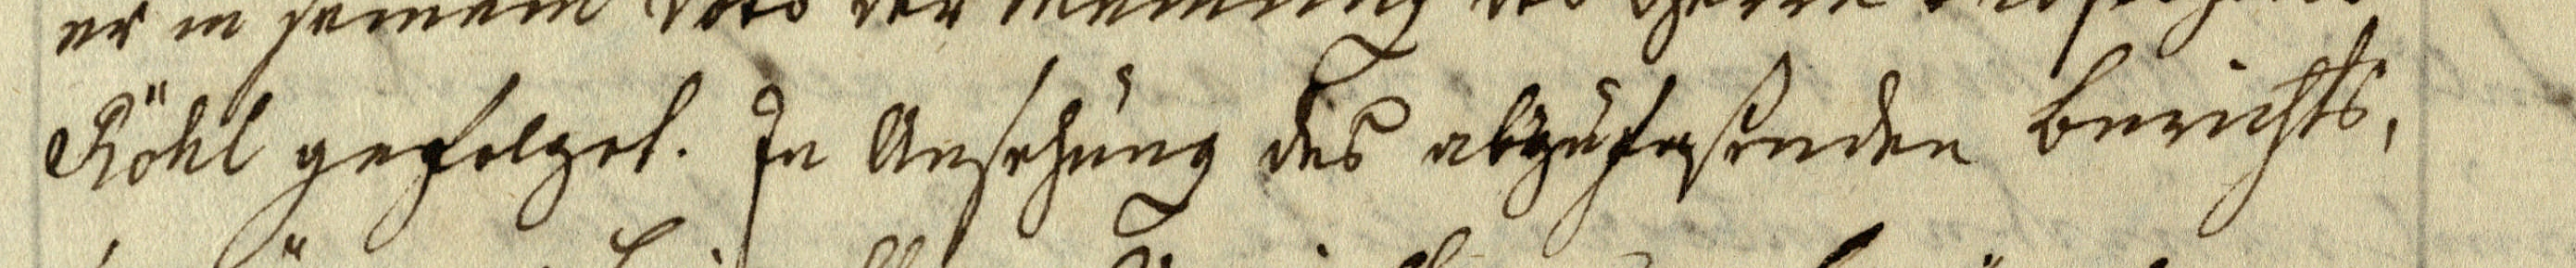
Röhl gefolget. In Ansehung des abzufaßenden Berichts,
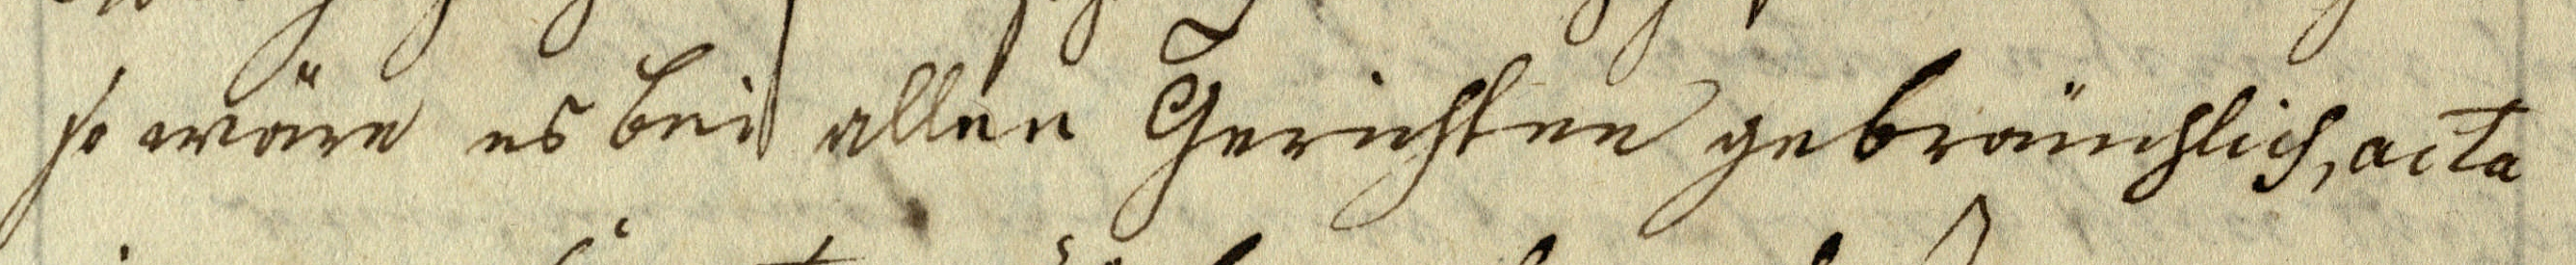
so wäre es bei allen Gerichten gebräuchlich, acta
